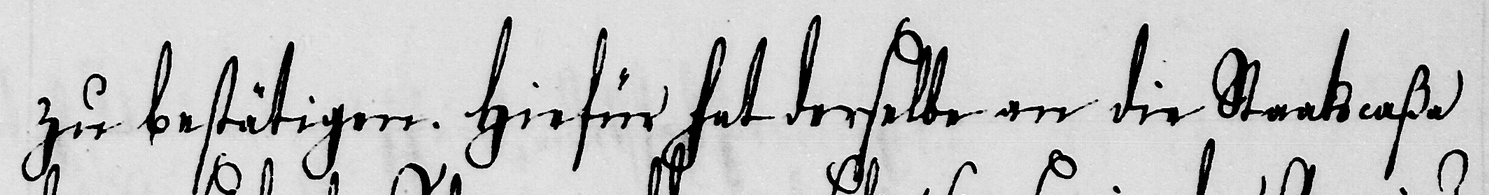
zu bestätigen. Hiefür hat derselbe an die Staatscaßa
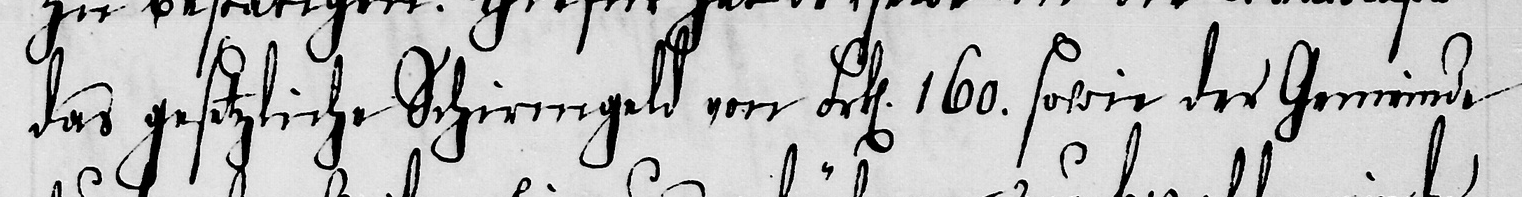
das gesetzliche Schirmgeld von Frk[en]. 160. sowie der
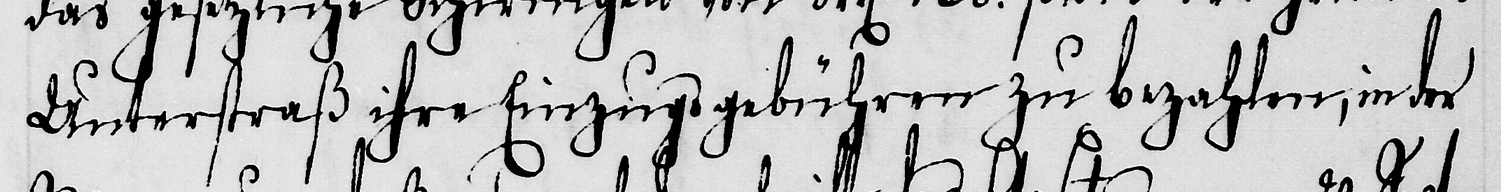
Unterstraß ihre Einzugsgebühren zu bezahlen, in der
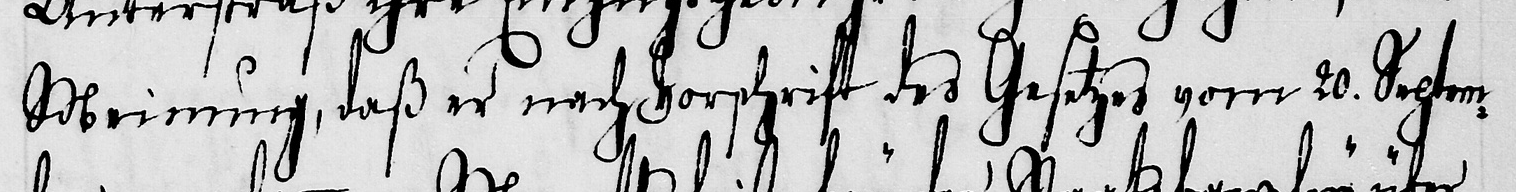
Meinung, daß er nach Vorschrift des Gesetzes vom 20. Septem¬
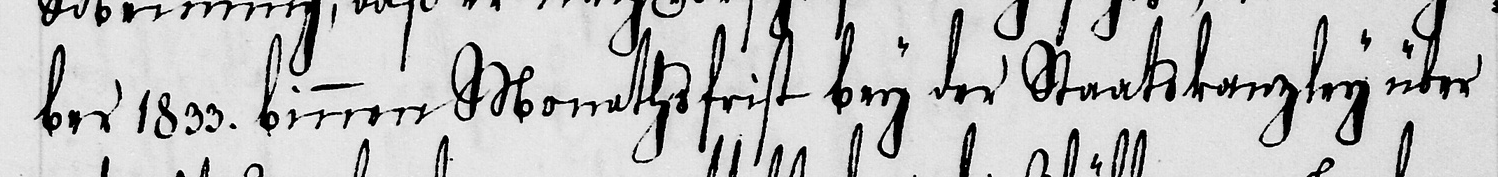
ber 1833. binnen Monathsfrist bey der Staatskanzley über
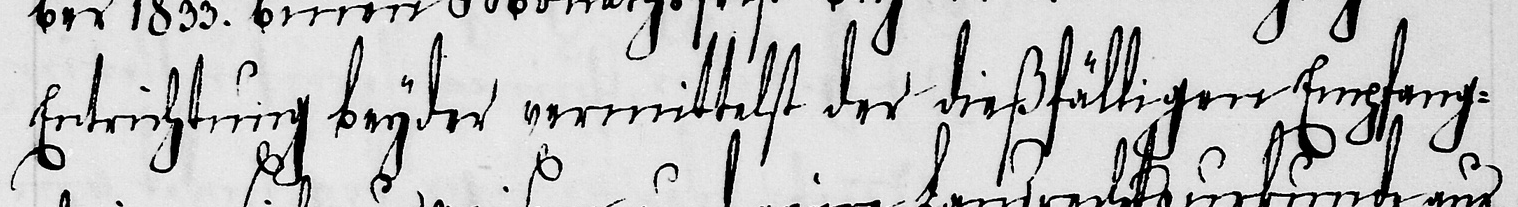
Entrichtung beyder vermittelst der dießfälligen Empfang¬
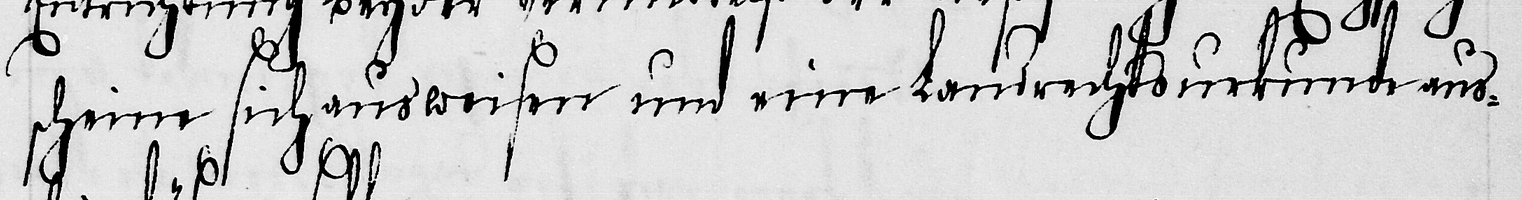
scheine sich ausweisen und eine Landrechtsurkunde aus¬
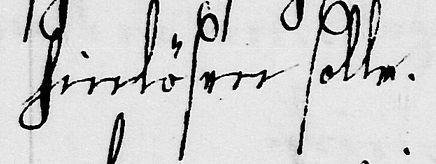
hinlösen solle.
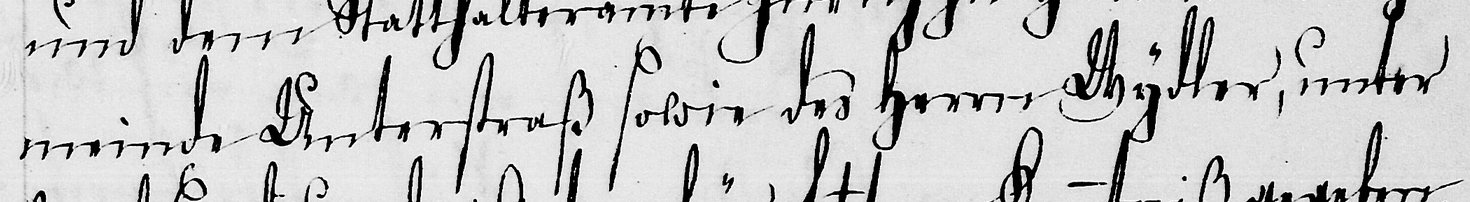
meinde Unterstraß sowie des Herrn Wydler, unter
